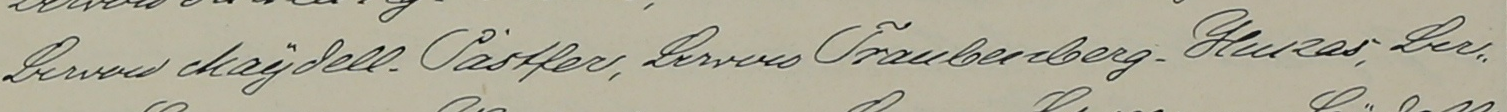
Baron Maydell-Pastfer, Baron Traubenberg-Hukas, Ba-
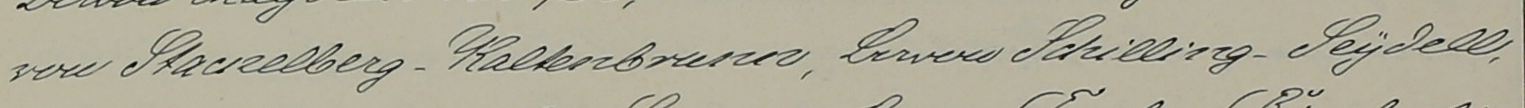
ron Stackelberg-Kaltenbrunn, Baron Schilling-Seydell,
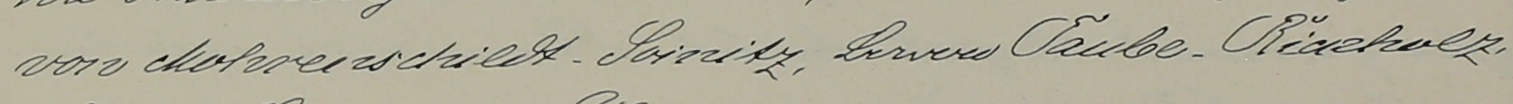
von Mohrenschildt-Soinitz, Baron Taube-Rickholz,
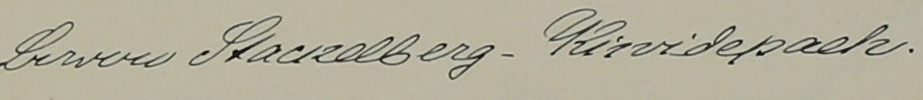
Baron Stackelberg-Kiwidepaeh.
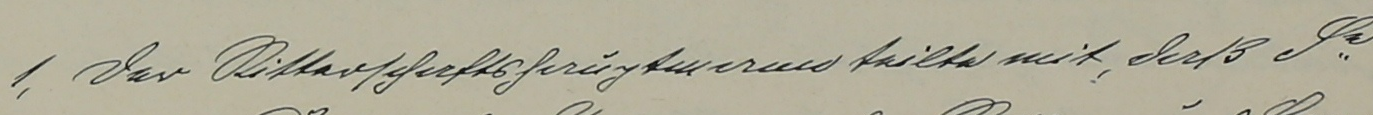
1. Der Ritterschaftshauptmann teilte mit, daß Se.
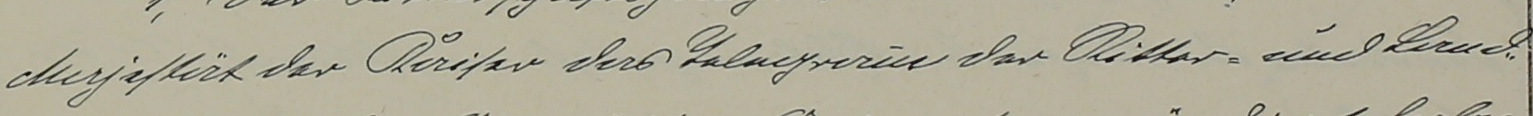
Majestät der Kaiser das Telegramm der Ritter- und Land-
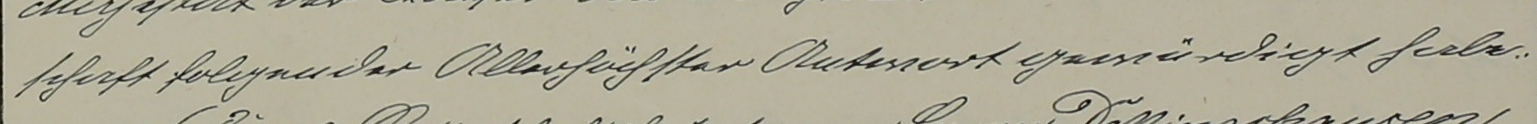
schaft folgender Allerhöchster Antwort gewürdigt habe:
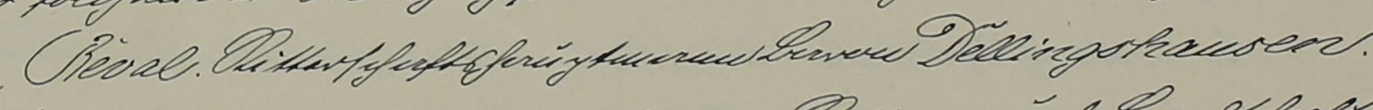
„Reval. Ritterschaftshauptmann Baron Dellingshausen.
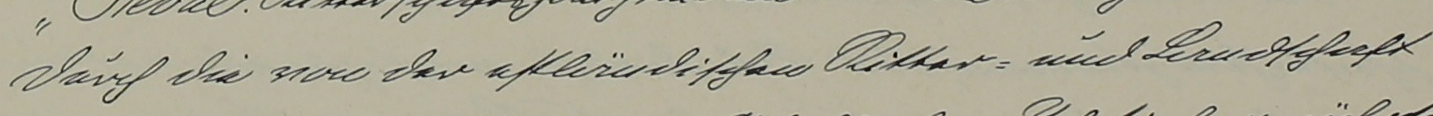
Durch die von der estländischen Ritter- und Landschaft
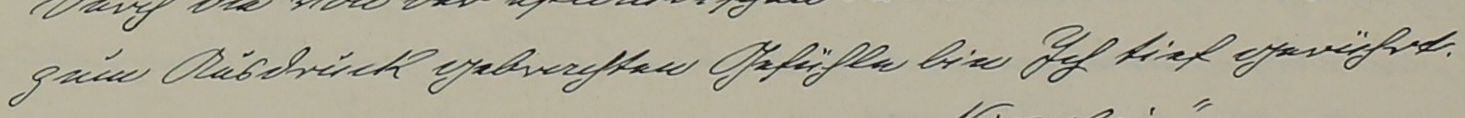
zum Ausdruck gebrachten Gefühle bin Ich tief gerührt.
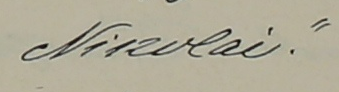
Nikolai."
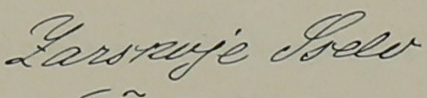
Zarskoje Sselo
